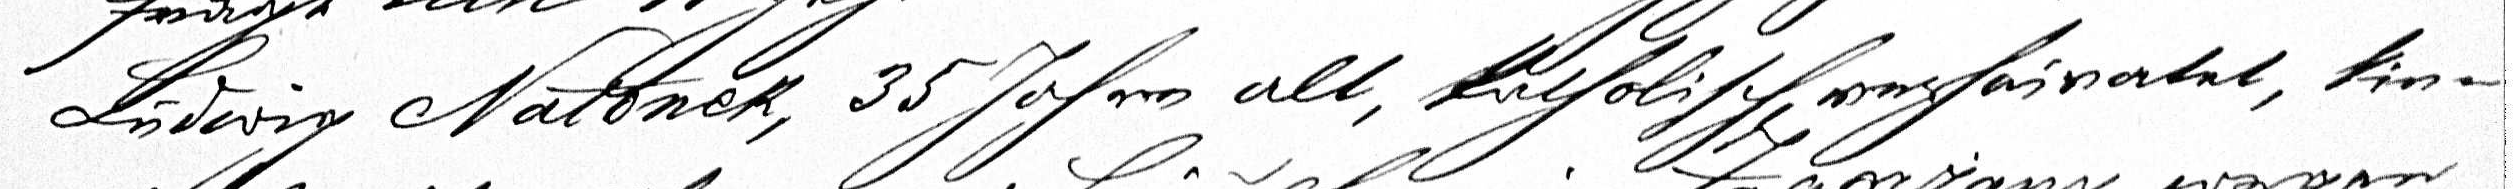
Ludwig Natonek, 35 Jahre alt, katholisch verheiratet, kin¬
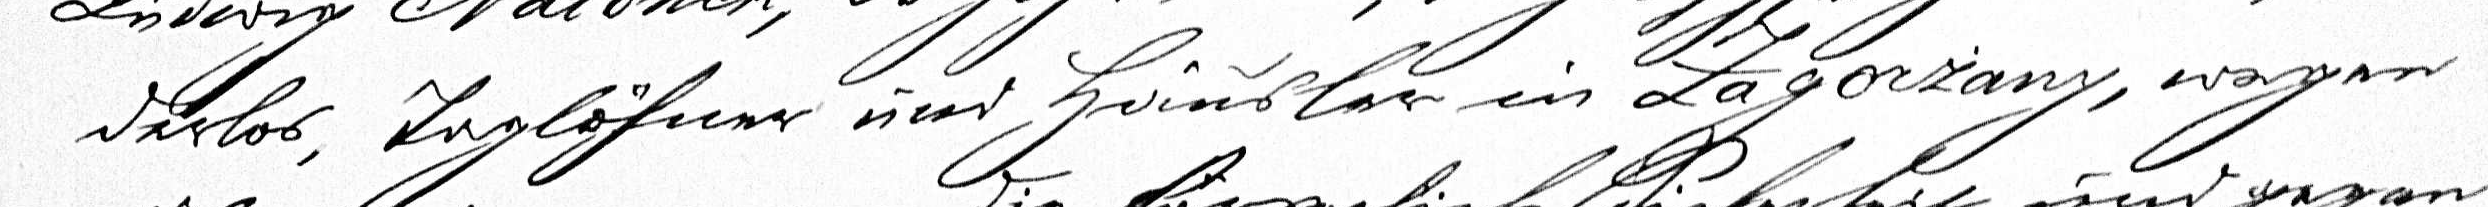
derlos, Taglöhner und Häusler in Zagorżany, wegen
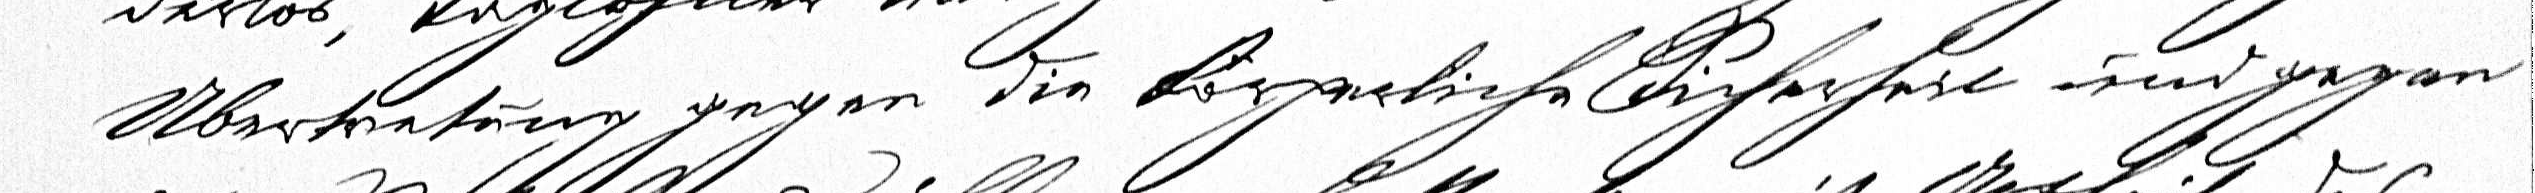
Ubertretugn gegen die körperliche Sicherheit und gegen
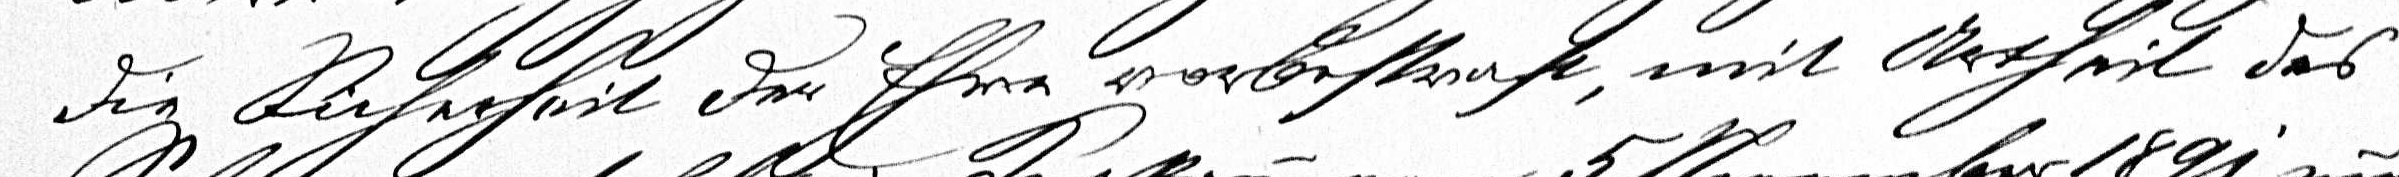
die Sicherheit der Ehre vorbestraft, mit Urtheil des
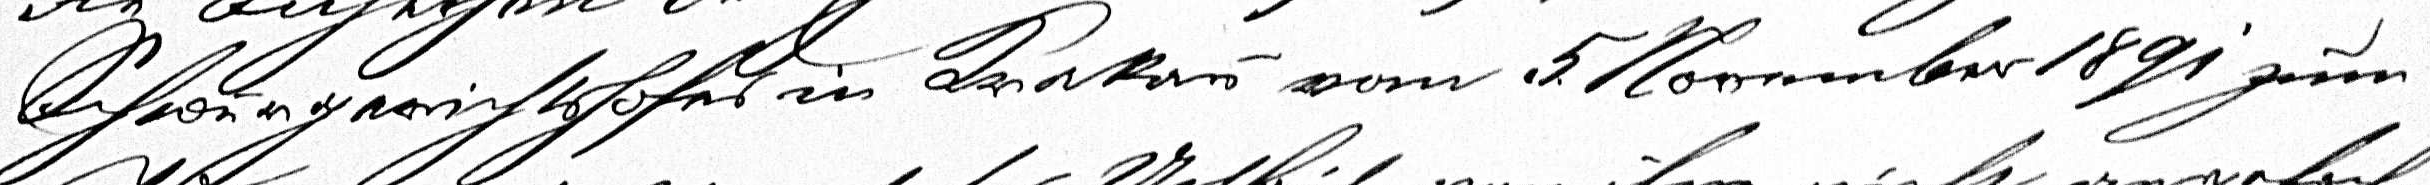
Schwurgerichtshofes in Krakau vom 5. November 1891 zum
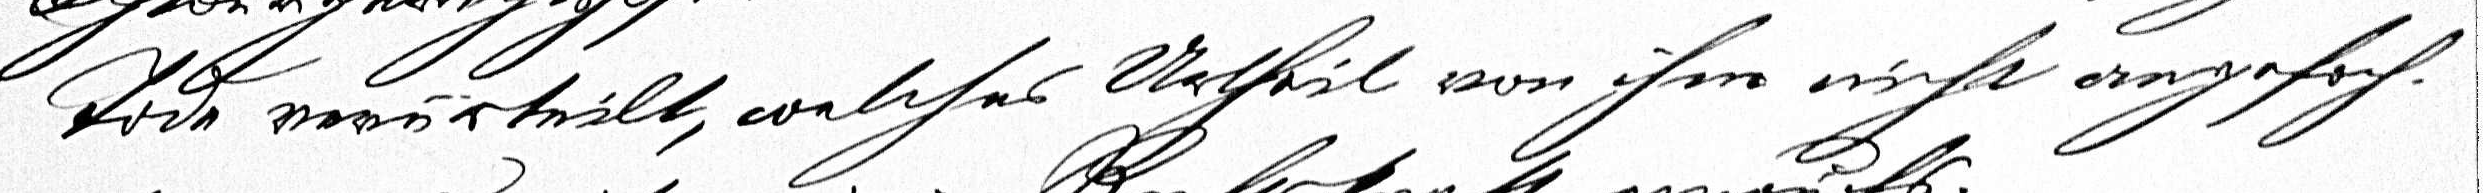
Tode verurtheilt, welches Urtheil von ihm nicht angefoch¬
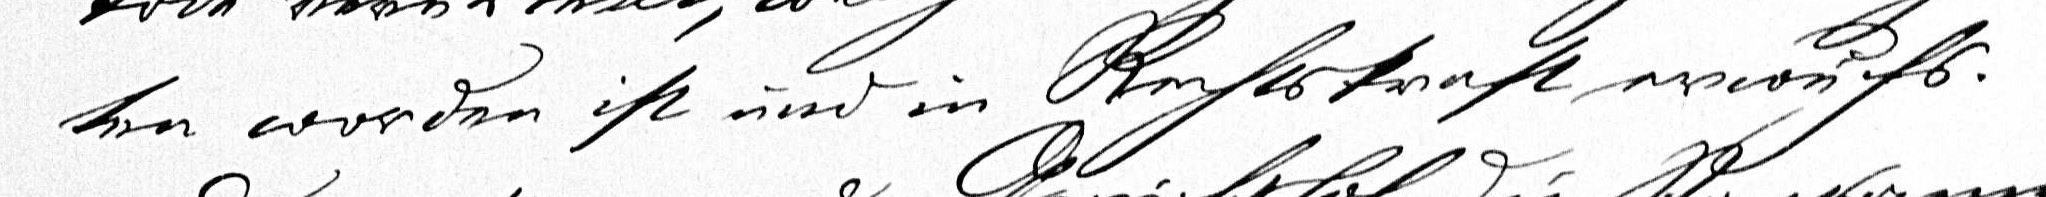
ten worden ist und in Rechtskraft erwuchs.
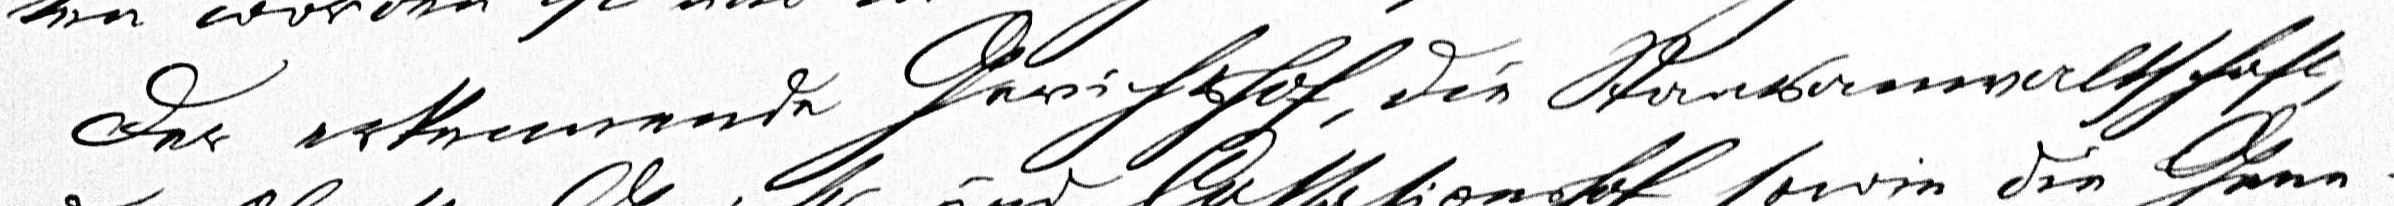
Der erkennende Gerichtshof, die Staatsanwaltschaft,
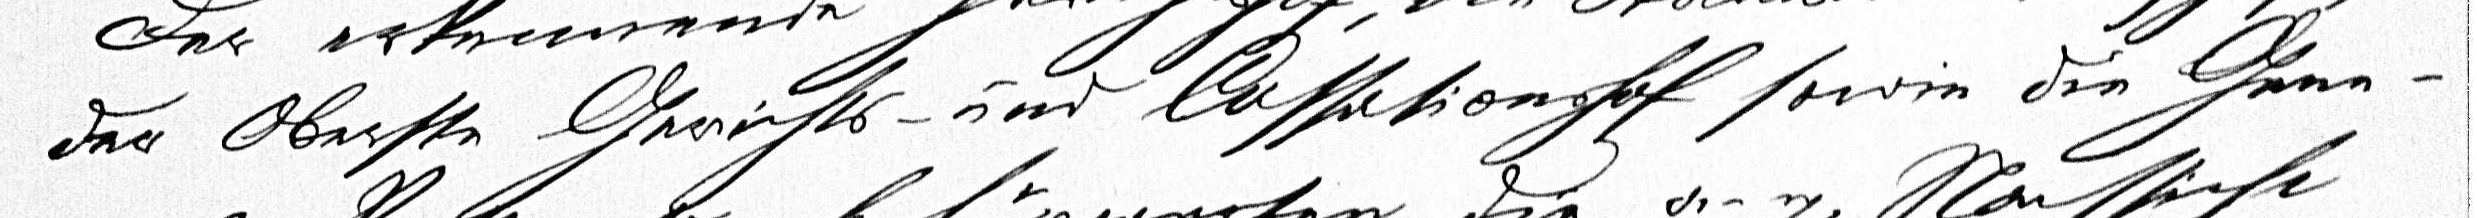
der Oberste Gerichts- und Cassationshof sowie die Gene¬
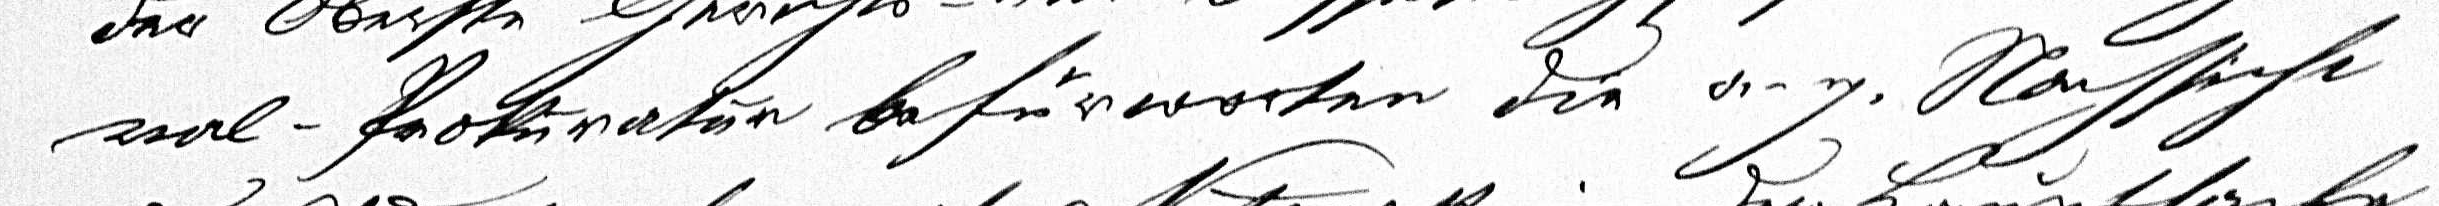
ral-Prokuratur befürworten die a.g. Nachsicht
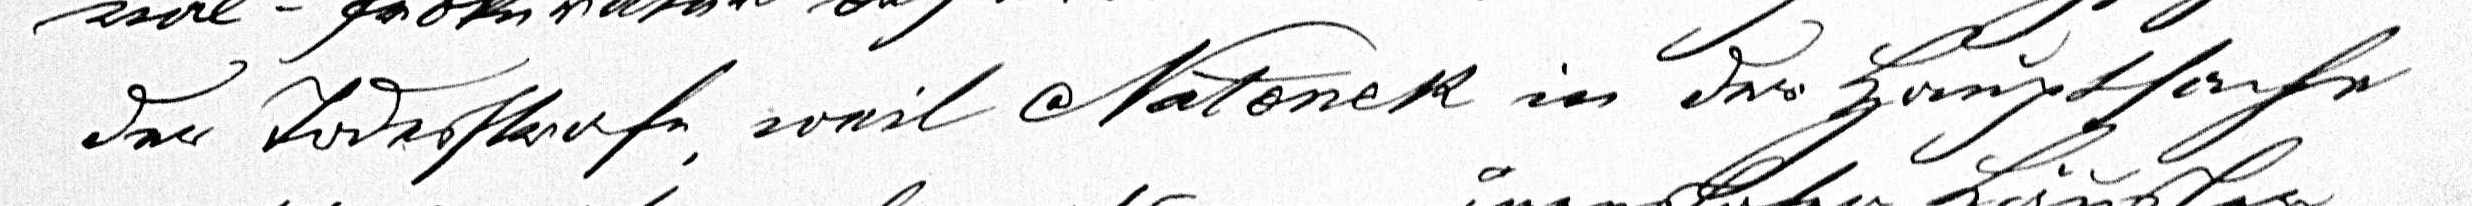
der Todesstrafe, weil Natonek in der Hauptsache
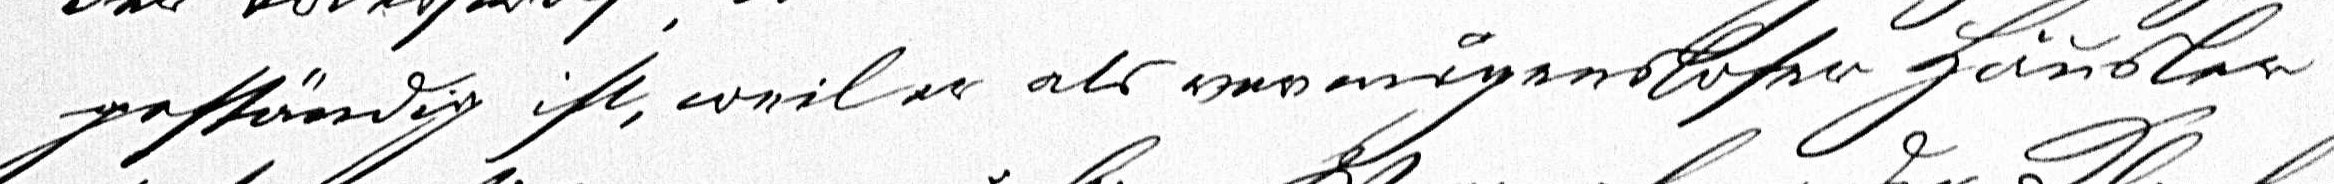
geständig ist, weil er als vermögensloser Häusler
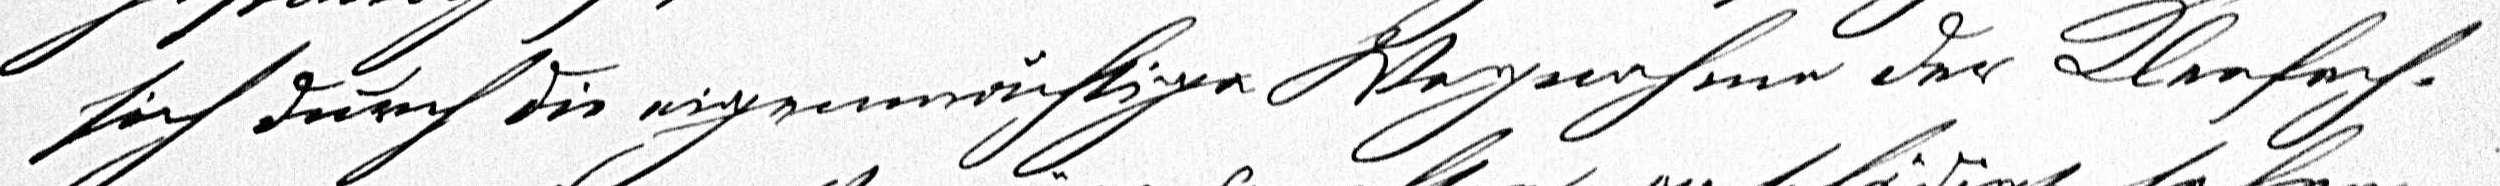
sich durch die eigenmächtige Wegnehmen der Kleefach¬
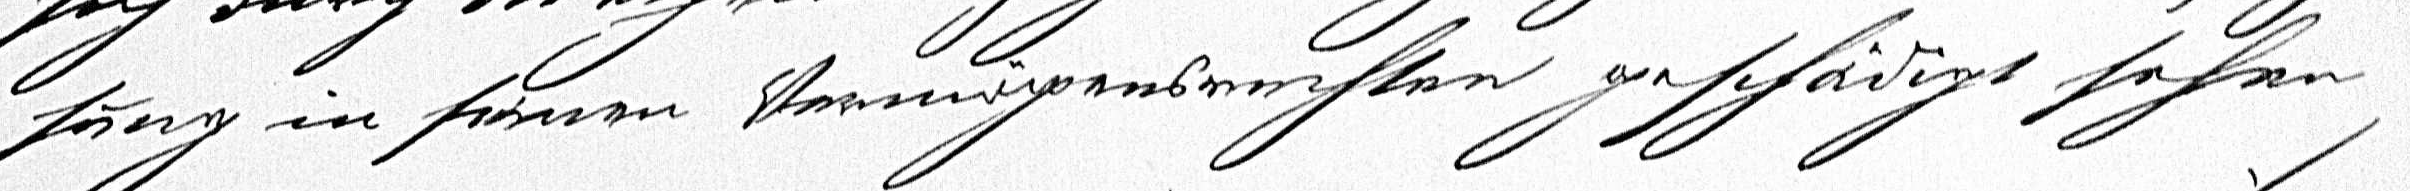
sung in seinen Vermögensrechten geschädigt sehen
